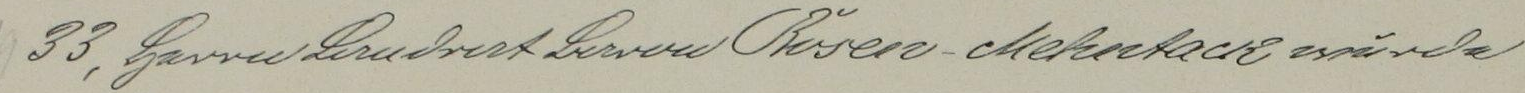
33. Herrn Landrat Baron Rosen-Mehntack wurde
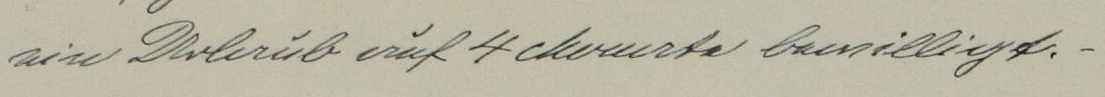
ein Urlaub auf 4 Monate bewilligt.
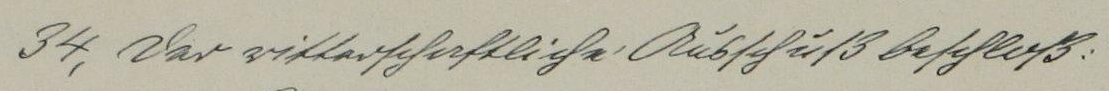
34. Der ritterschaftliche Ausschuß beschloß:
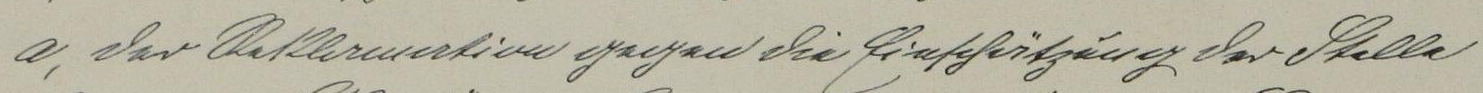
a. der Reklamation gegen die Einschätzung der Stelle
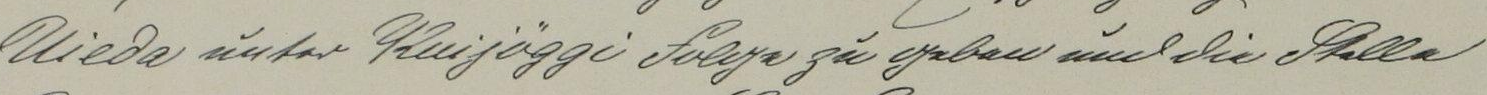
Uieda unter Kuijöggi Folge zu geben und die Stelle
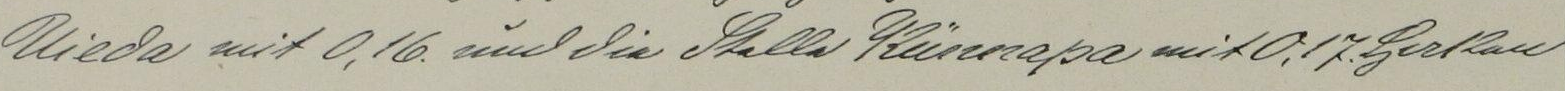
Uieda mit 0,16. und die Stelle Künnapa mit 0,17. Haken
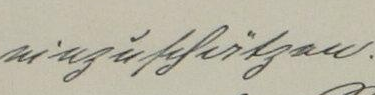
einzuschätzen.
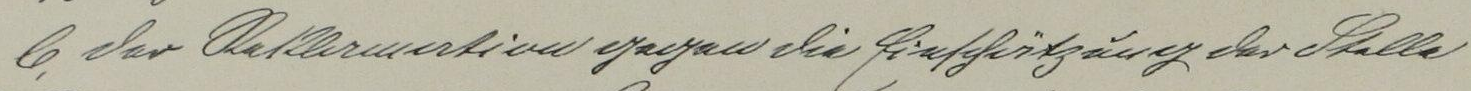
b. der Reklamation gegen die Einschätzung der Stelle
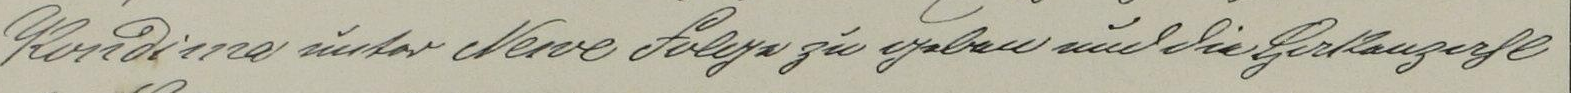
Kondima unter Newe Folge zu geben und die Hakenzahl
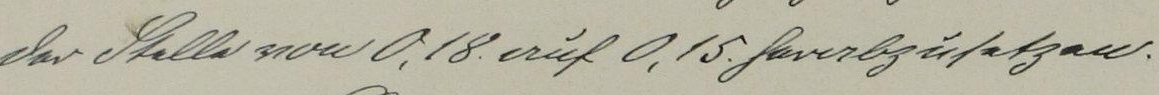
der Stelle von 0,18. auf 0,15. herabzusetzen.
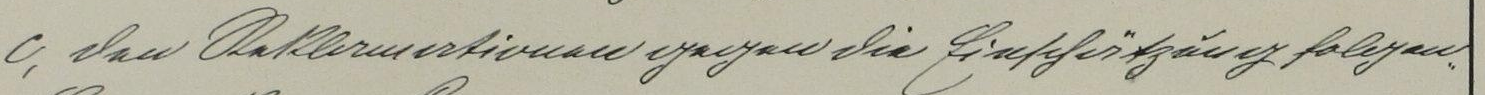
c. den Reklamationen gegen die Einschätzung folgen-
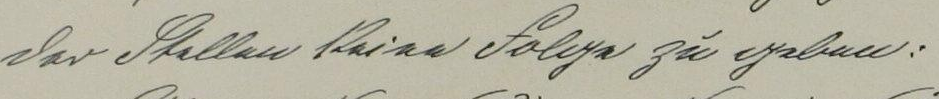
der Stellen keine Folge zu geben:
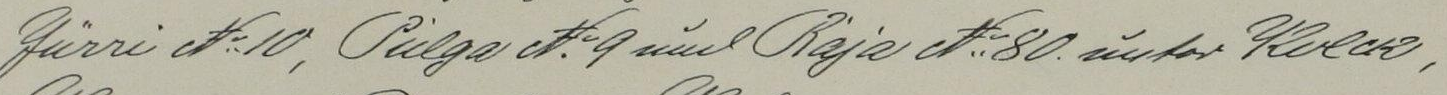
Jürri No. 10, Pulga No. 9 und Raja No. 80 unter Kolck,
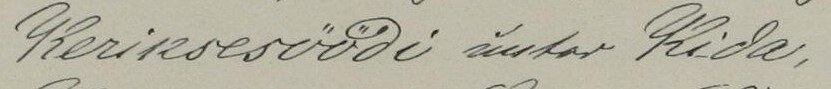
Keriksesöödi unter Kida,
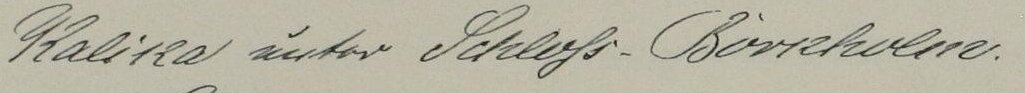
Kalika unter Schloss-Borkholm.
